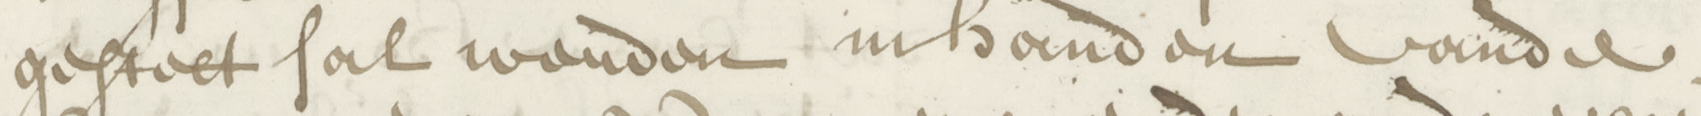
gestelt sal werden in handen vande
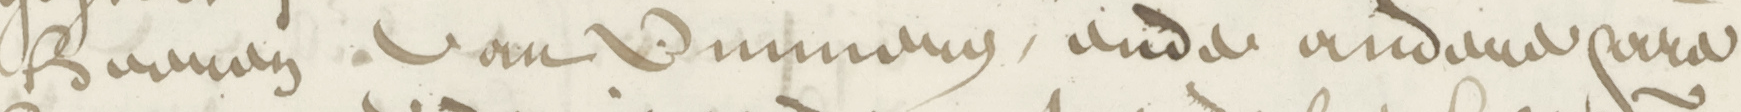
Heeren van Ommeren, ende andere hare
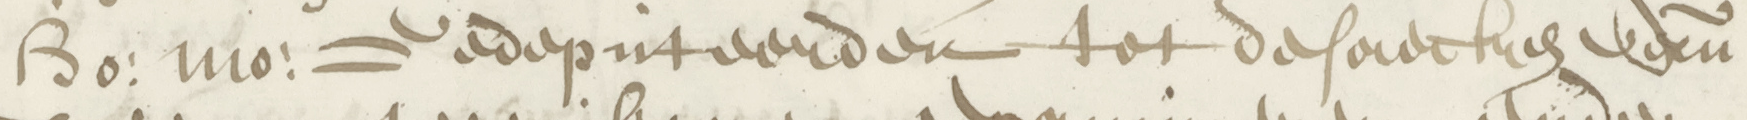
Ho:Mo: Gedeputeerden tot de saecken van
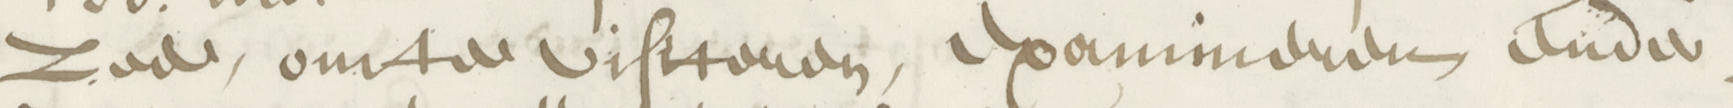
Zee, om te visiteren, examineren, ende
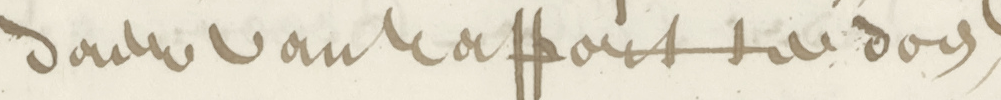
daer van rapport t doen.
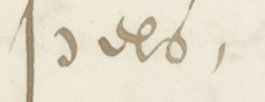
Pels,
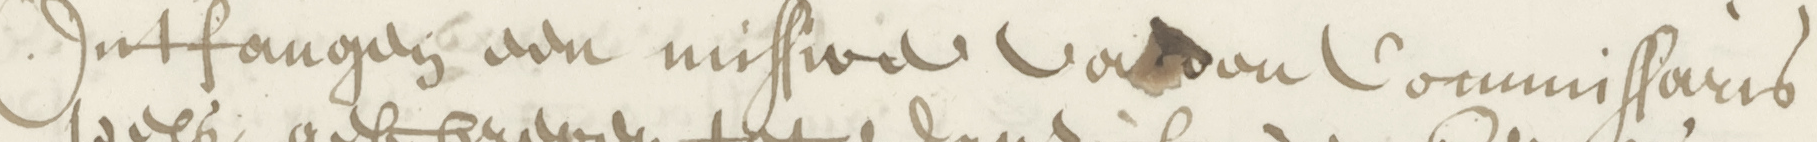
Ontfangen een missive vanden Commissaris
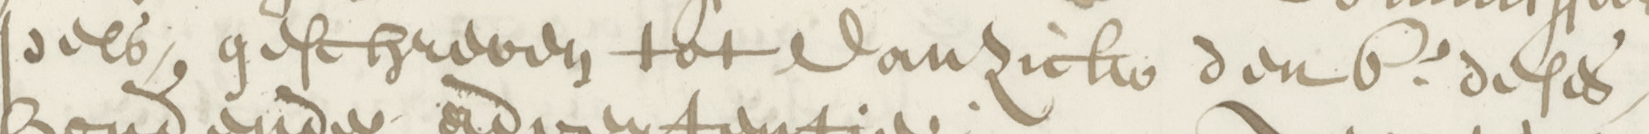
Pels, geschreven tot Danzick den 6e. deses,
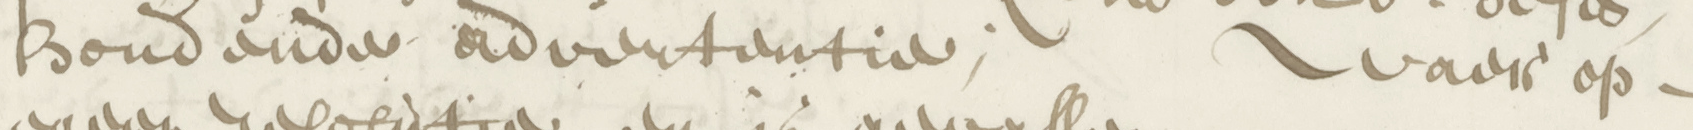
houdende advertentie; Waer op —
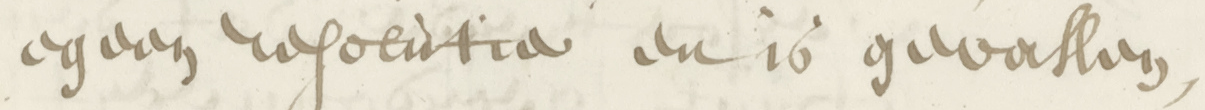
egeen resolutie en is gevallen.
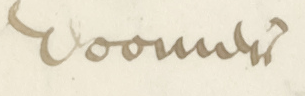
Roomer
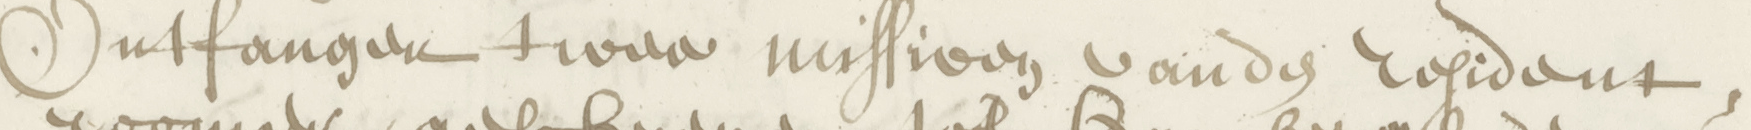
Ontfangen twee missiven vanden Resident,
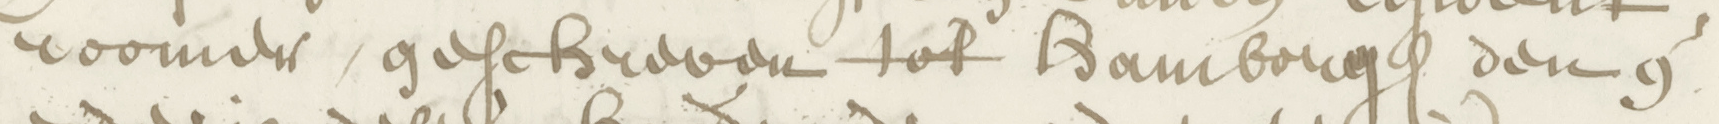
roomer, geschreven tot Hamborgh den 9e.
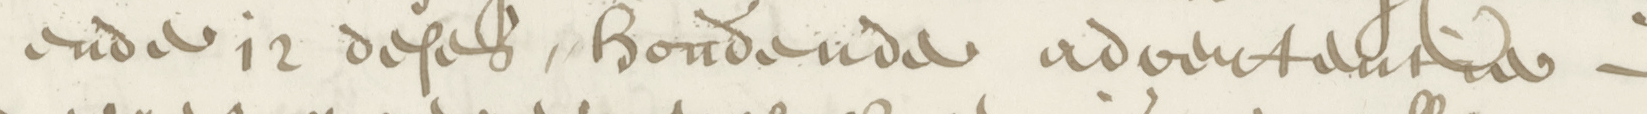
ende 12 deses, houdende advertentie
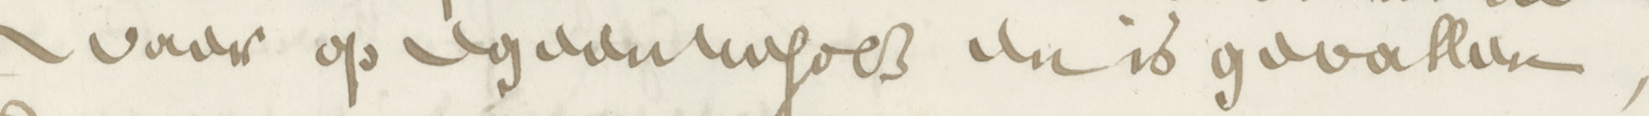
Waer op egeen resol en is gevallen.
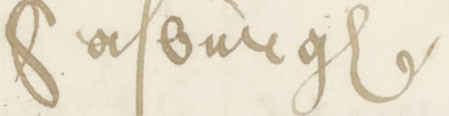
Sasburgh
